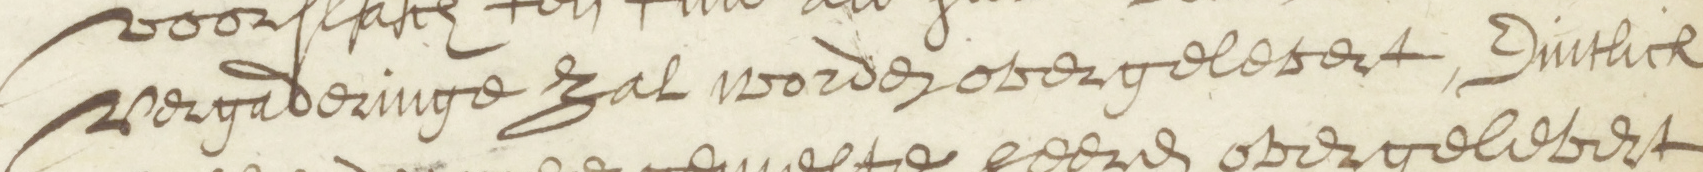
Vergaderinge zal worden overgelevert. Eintlick
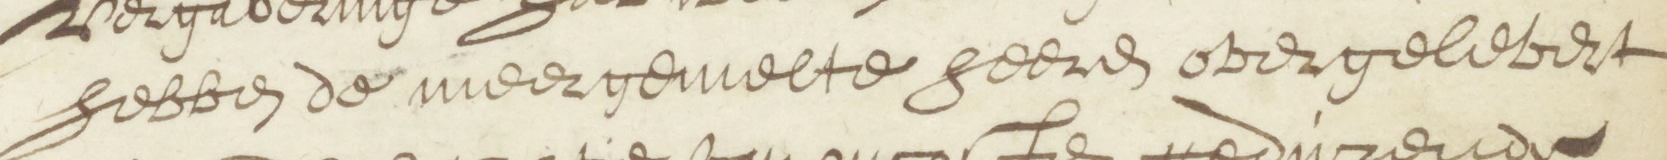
hebben de meergemelte heeren overgelevert
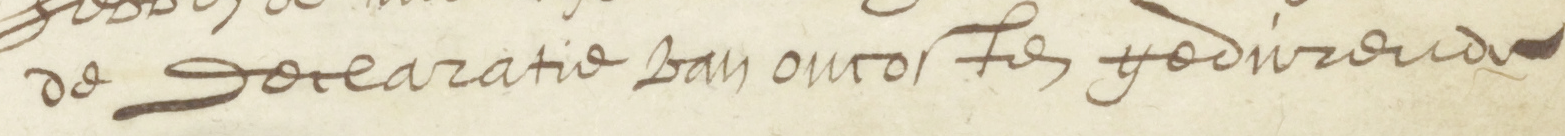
de Declaratie van oncosten gedurende
